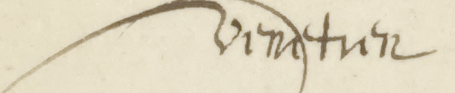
venetien
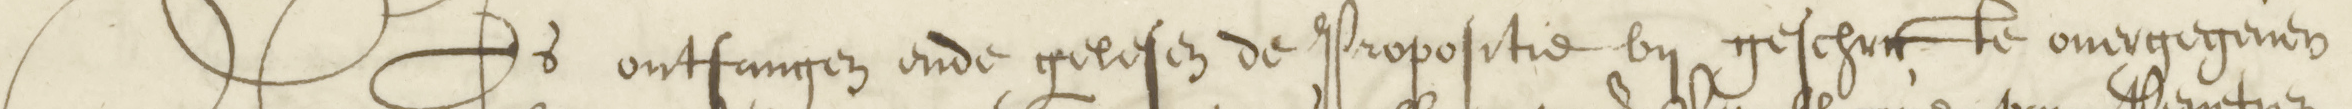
Is ontfangen ende gelesen de Propositie by geschrifte ouergegeuen
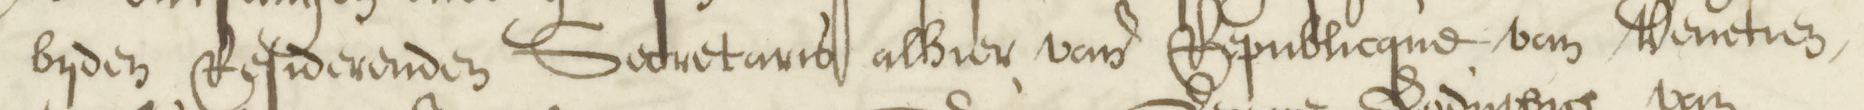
byden residerenden Secretaris alhier van Republicque van Venetien
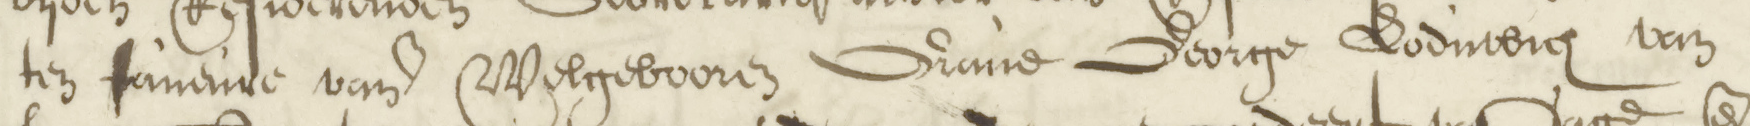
ten faueure van Welgebooren Graue George Loduwich van
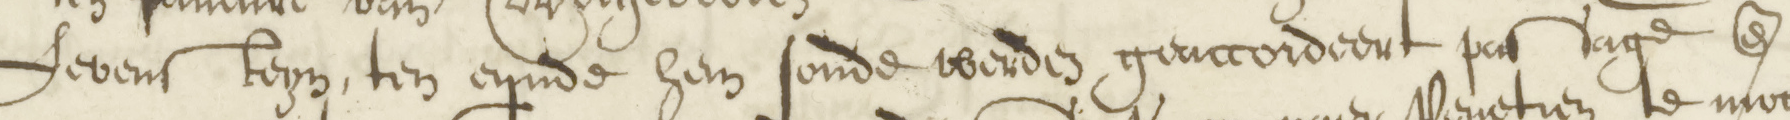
Sevensteyn ten eynde hem soude worden geaccordeert passage &
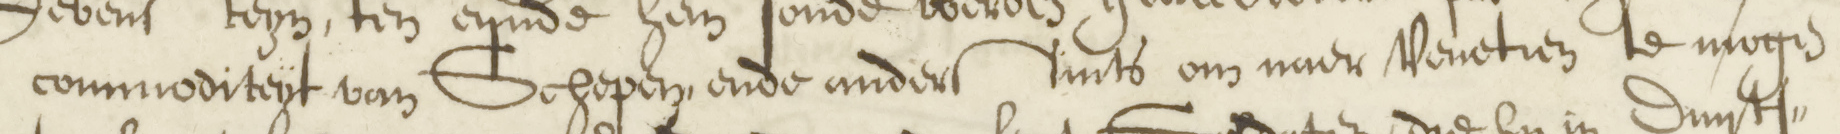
commoditeijt van Schepen, ende anderssints om naer Venetien te mogen
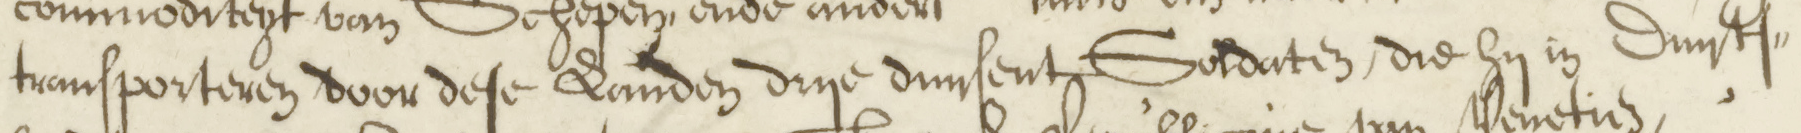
transporteren door dese Landen drye duysent Soldaten, die hy in Duyts„
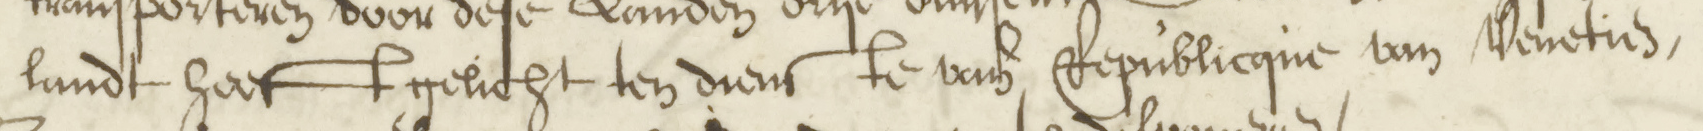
landt heeft gelicht ten dienste van Republicque van Venetien.
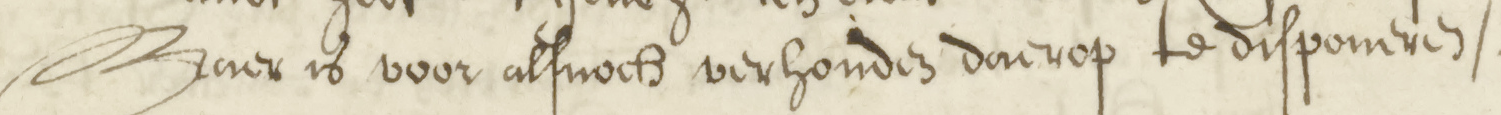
Maer is voor alsnoch verhouden daerop te disponeren.
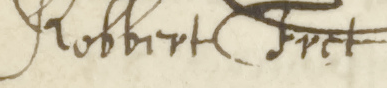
Robbert Fret
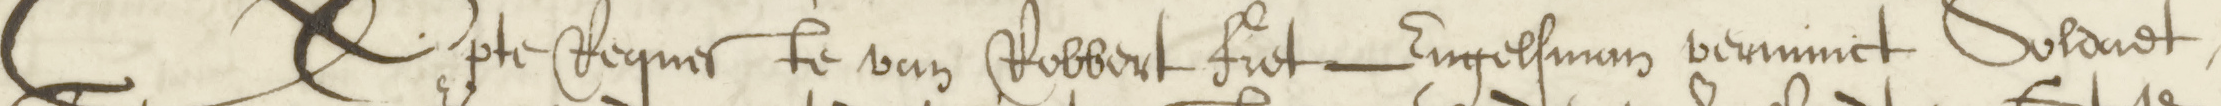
Opte Requeste van Robbert Fret Engelsman verminct Soldaet,
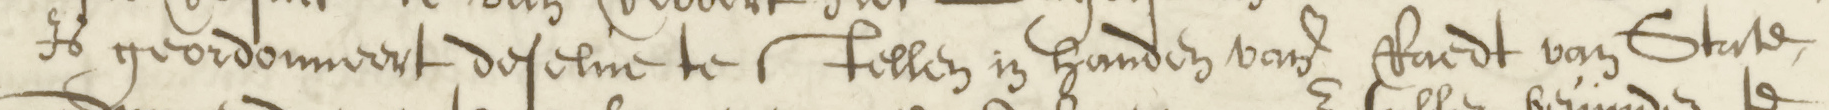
Is geordonneert deselue te stellen in handen van Raedt van State,
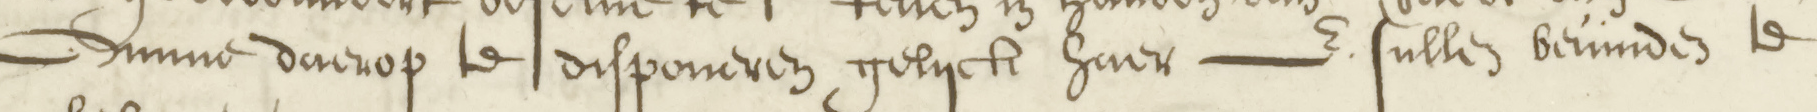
omme daerop te disponeren gelyck haer E. sullen beuinden te
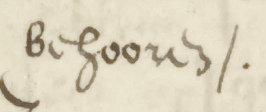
behooren.
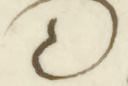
D
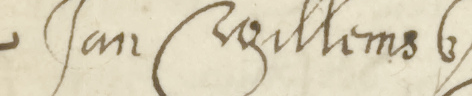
Jan Willemsz
